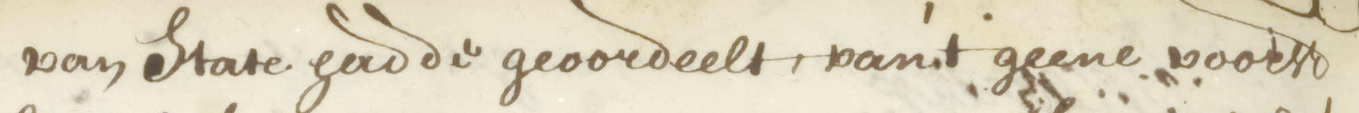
van State hadde geoordeelt, vant geene voorsz
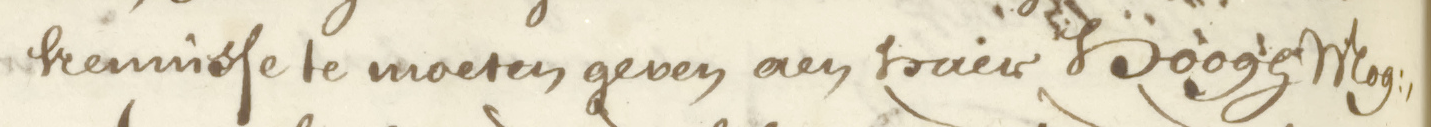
kennisse te moeten geven aen haer Hoogh Mog:,
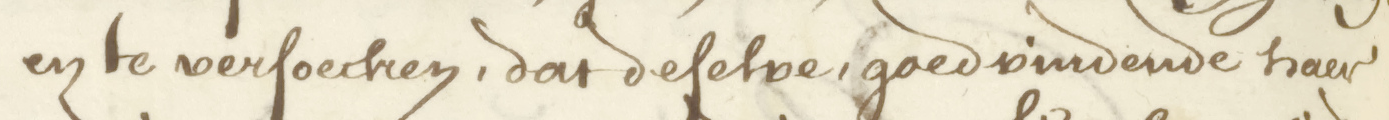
en te versoecken, dat deselve, goedvindende haer
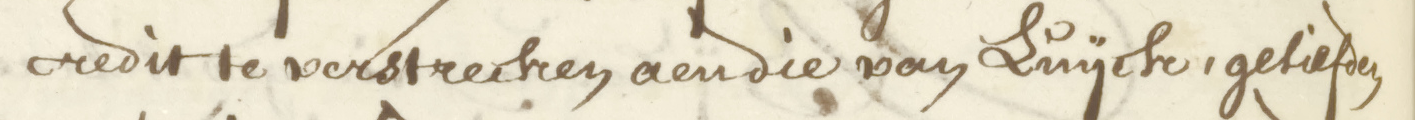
credit te verstrecken aen die van Luijck, geliefden
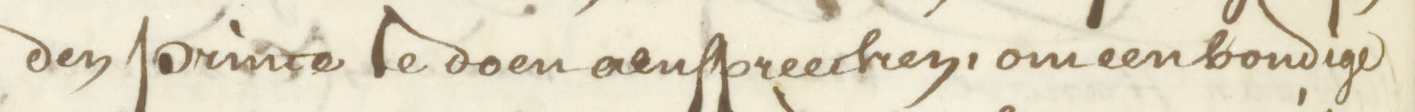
den Prince te doen aenspreecken, om een bondige
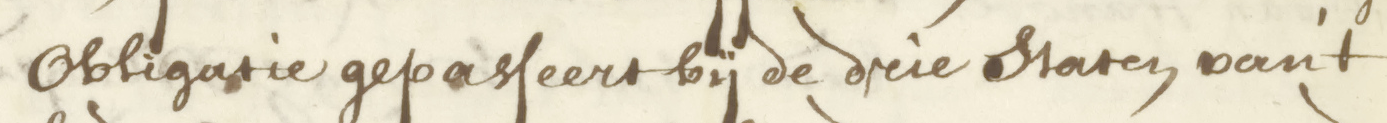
Obligatie gepasseert bij de drie Staten van‛t
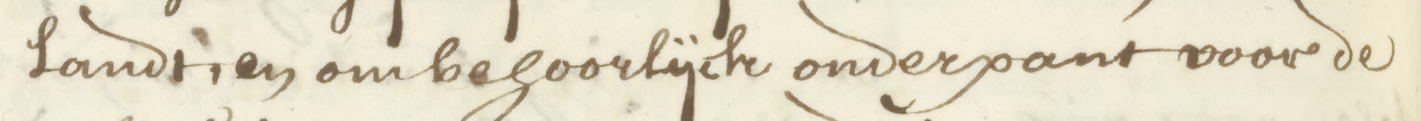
Landt, en om behoorlijck onderpant voor de
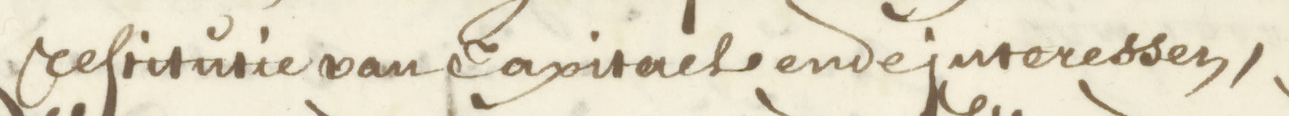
restitutie van Capitael ende interessen,
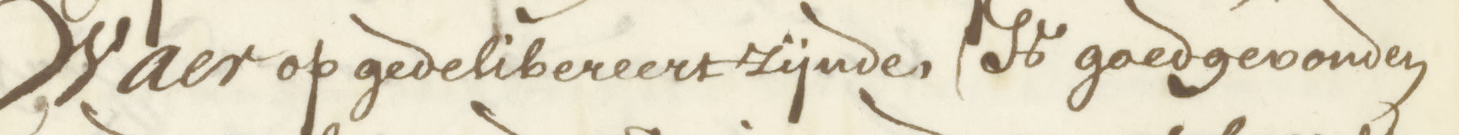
Waer op gedelibereert zijnden, Is goedgevonden
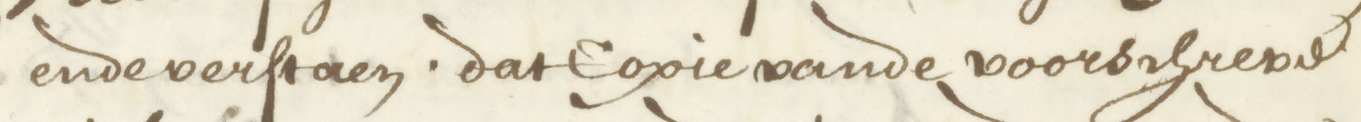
ende verstaen, dat Copie vande voorschreve
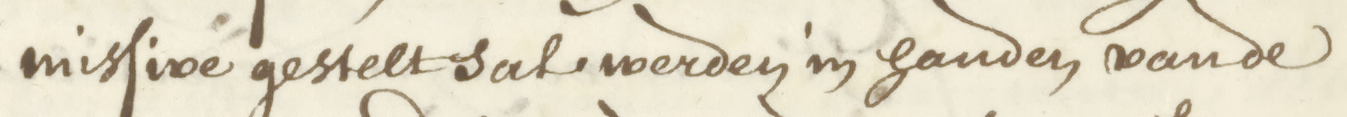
missive gestelt sal werden in handen van de
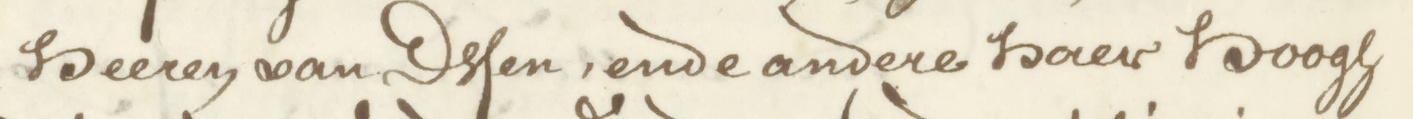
Heeren van Olsen, ende andere haer Hoogh
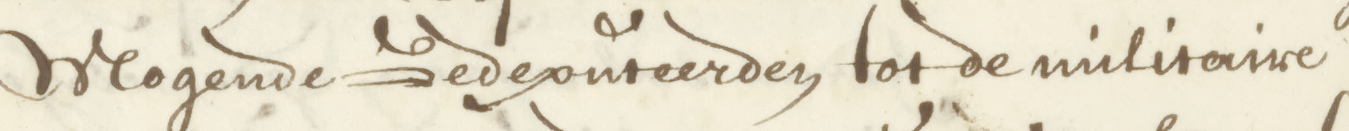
Mogende Gedeputeerden tot de militaire
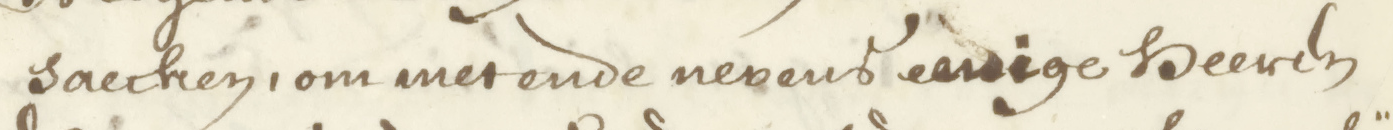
saecken, om met ende nevens eenige Heeren
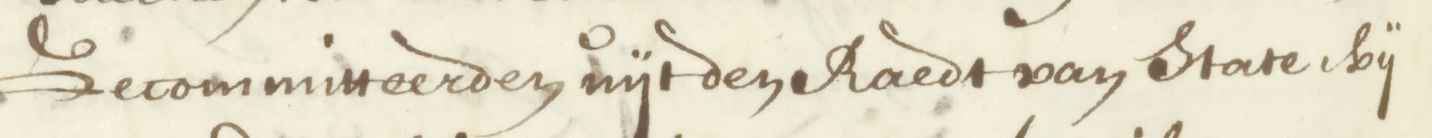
Gecommitteerden uijt den Raedt van State, bij
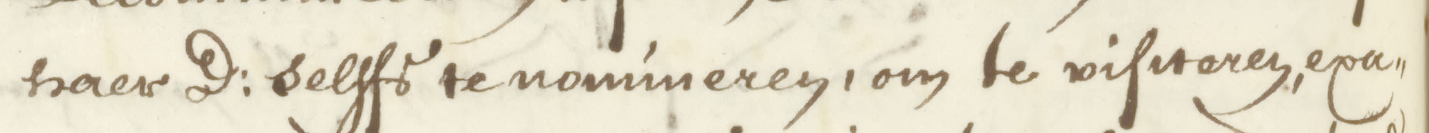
haer E: selffs te nomineren, om te visiteren, exa„
